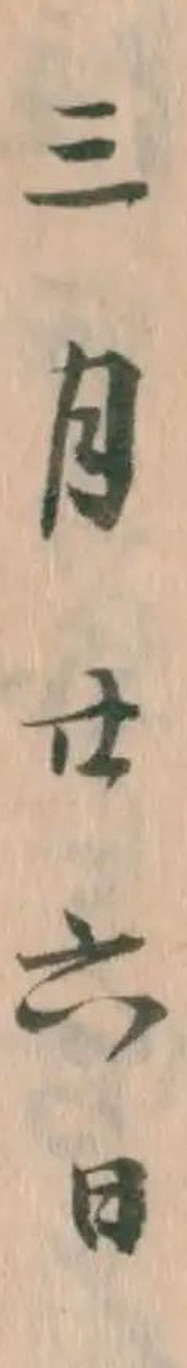三月廿六日
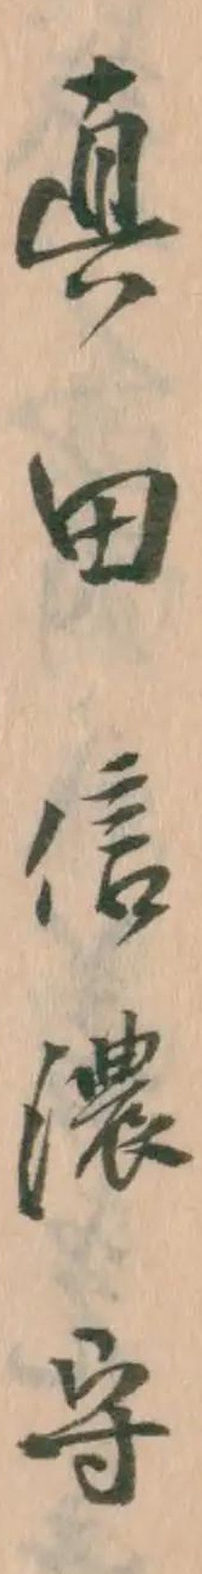真田信濃守
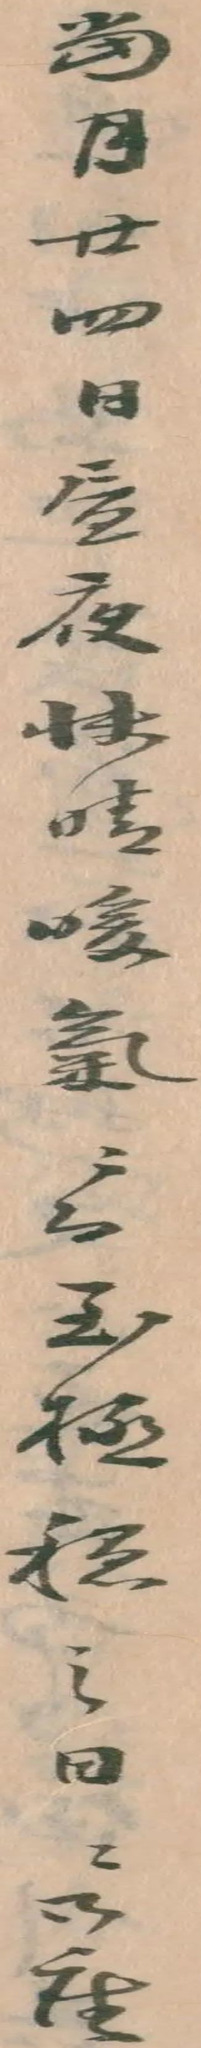当月廿四日昼夜快晴暖気ニ而至極穏之日ニ御座
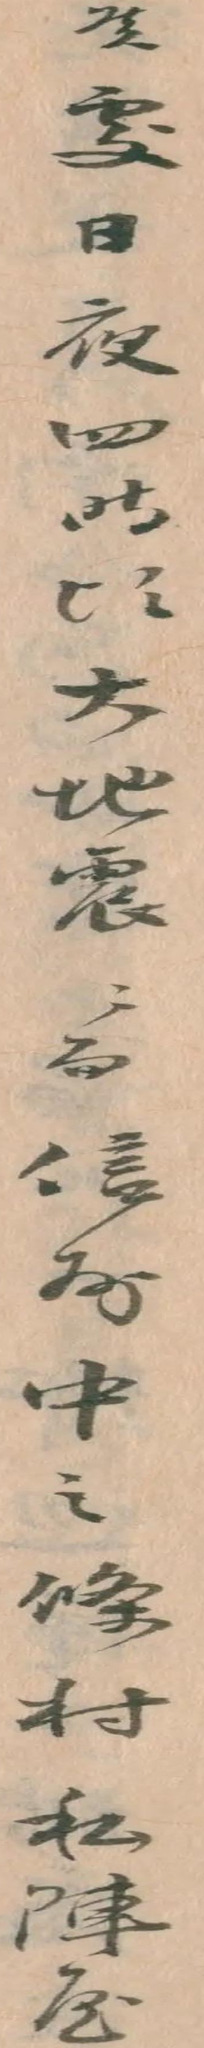候処同夜四時比大地震ニ而信州中之条村私陣屋
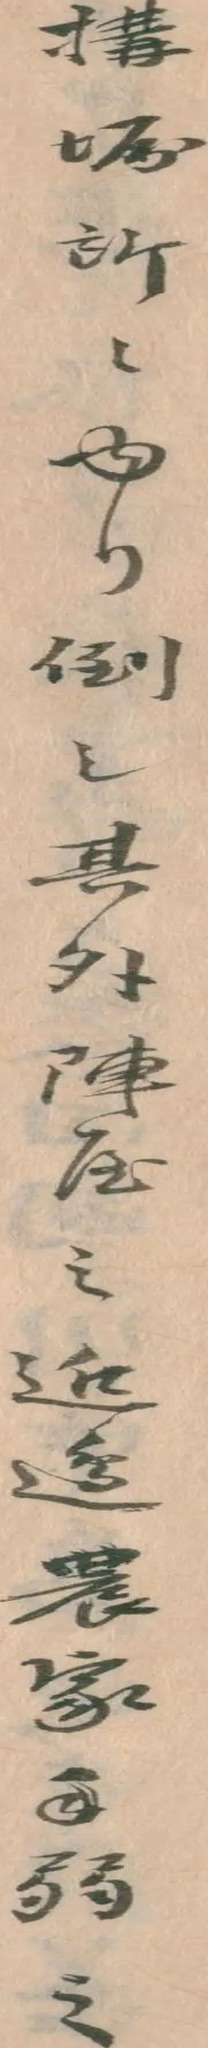構塀所々ゆり倒し其外陣屋之近辺農家手弱之
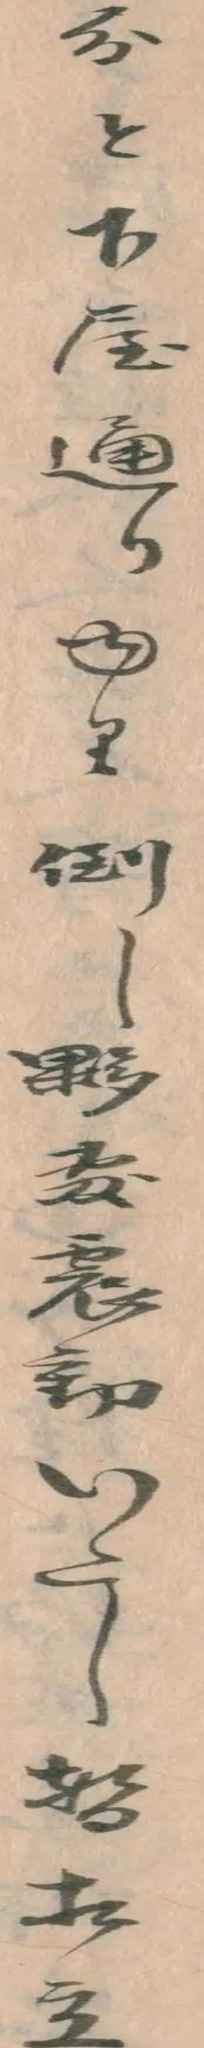分と下家通りゆり倒し夥敷震動いたし暫相立
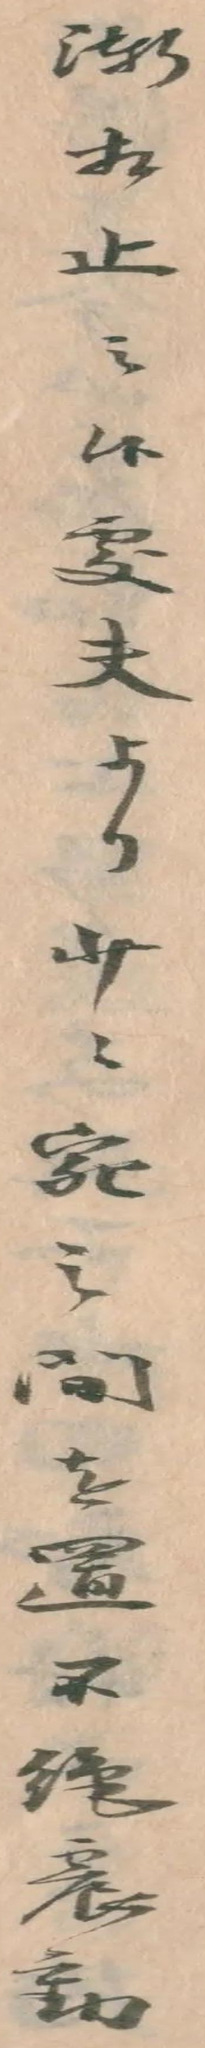漸相止ミ候処夫より少々宛之間を置不絶震動
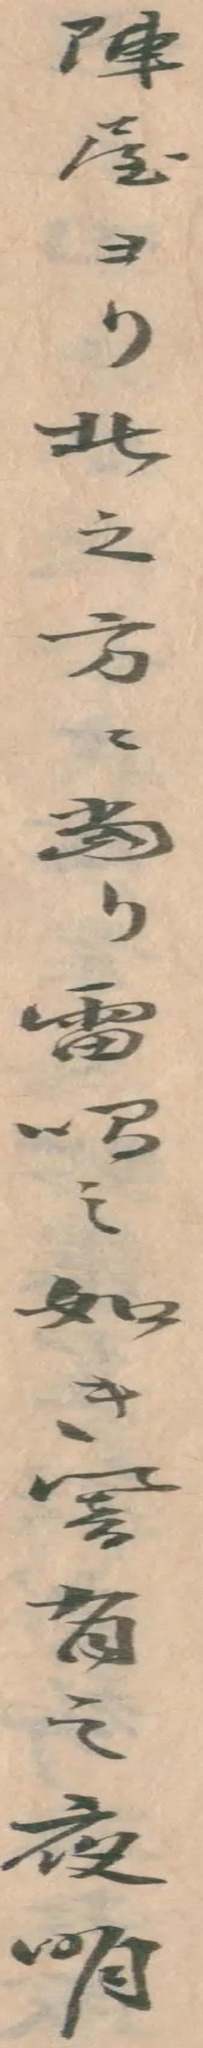陣屋ヨリ北之方ニ当り雷鳴之如キ響有之夜明

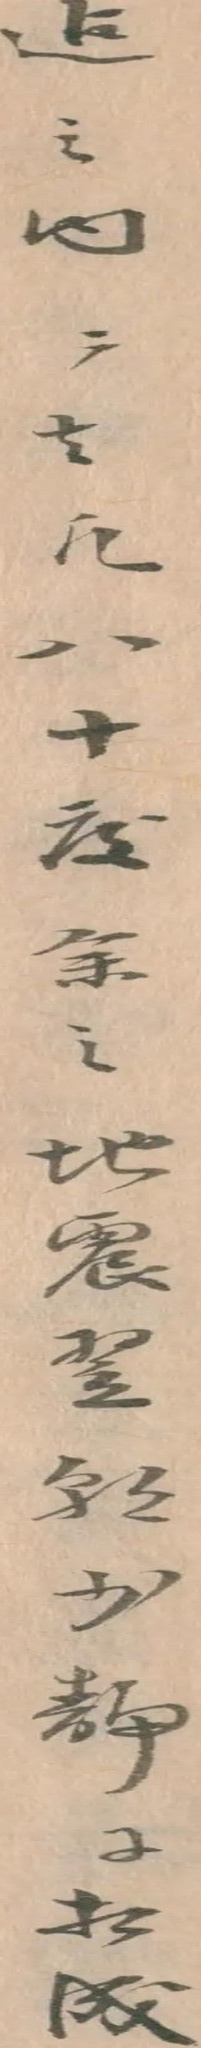迄之内ニ者凡八拾度余之地震翌朝少静ニ相成
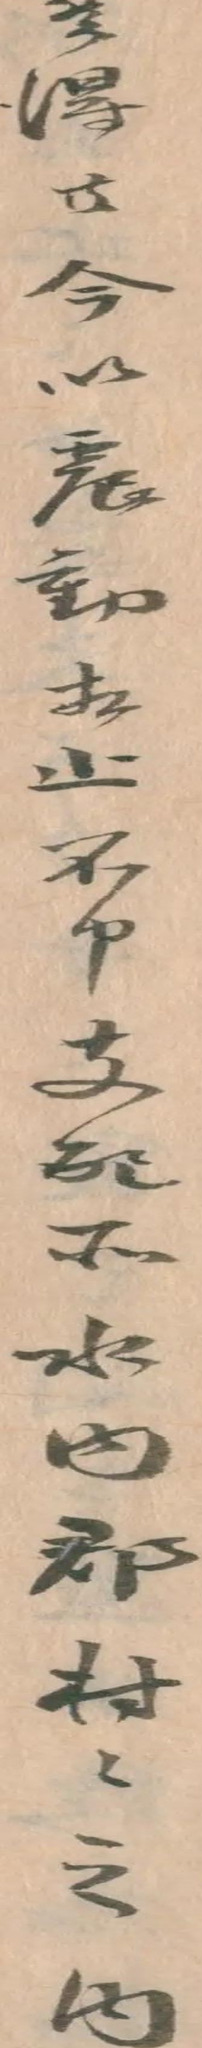候得共今以震動相止不申支配所水内郡村々之内
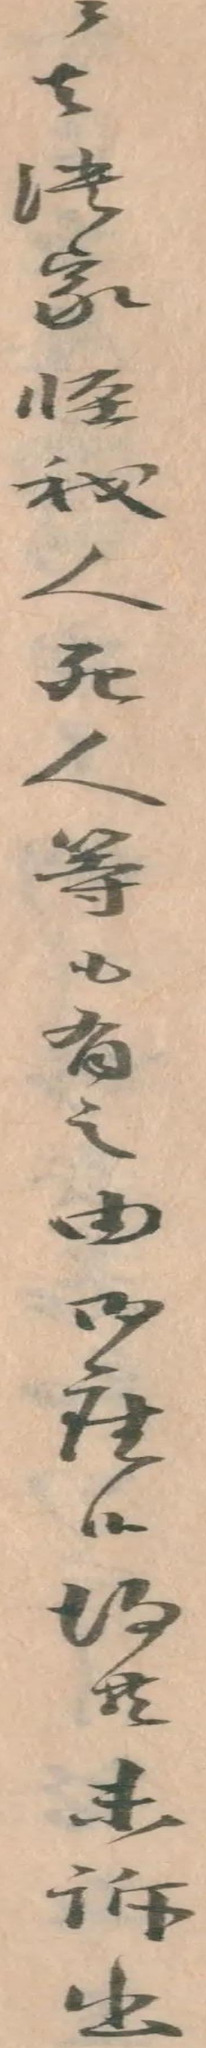二者潰家怪我死人等も有之候由御座候得共未訴出
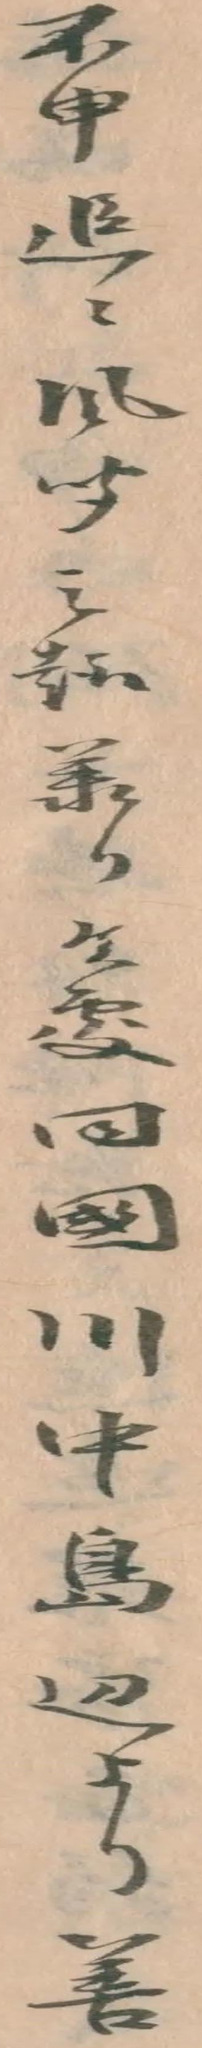不申追々風聞之趣承り候処同国川中島辺ゟ善
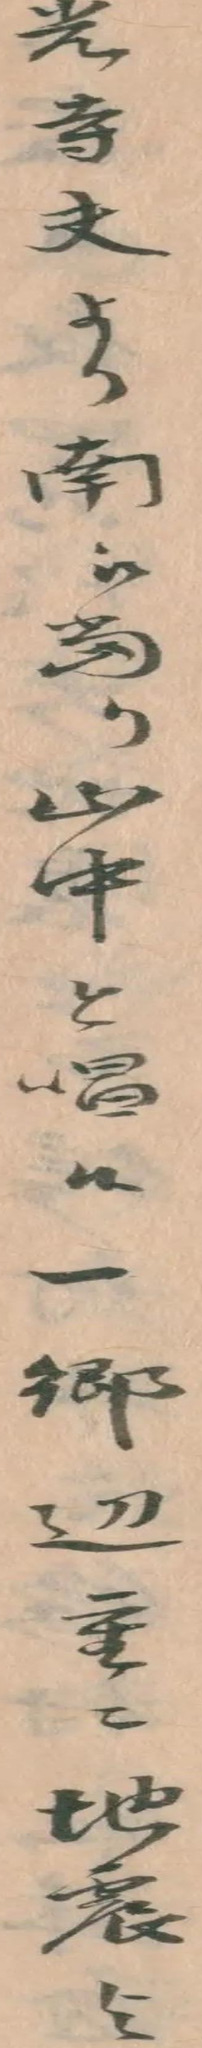光寺夫より南江当り山中と唱候一郷村辺重二地震と
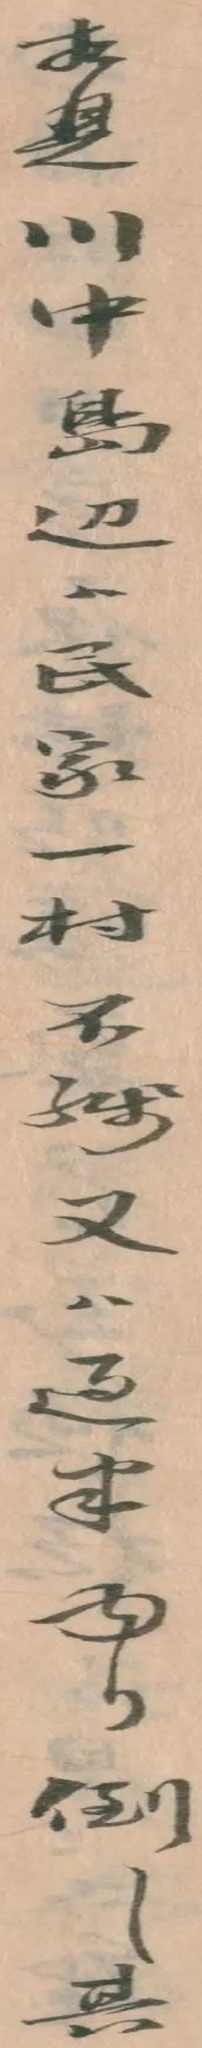相見川中島辺ハ民家一村不残又ハ過半ゆり倒し其
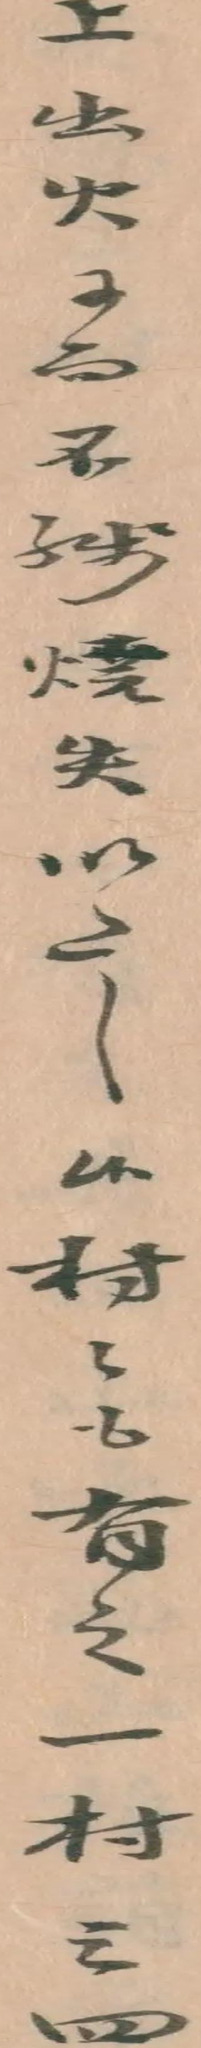上出火二而不残焼失いたし候村々も有之一村三四
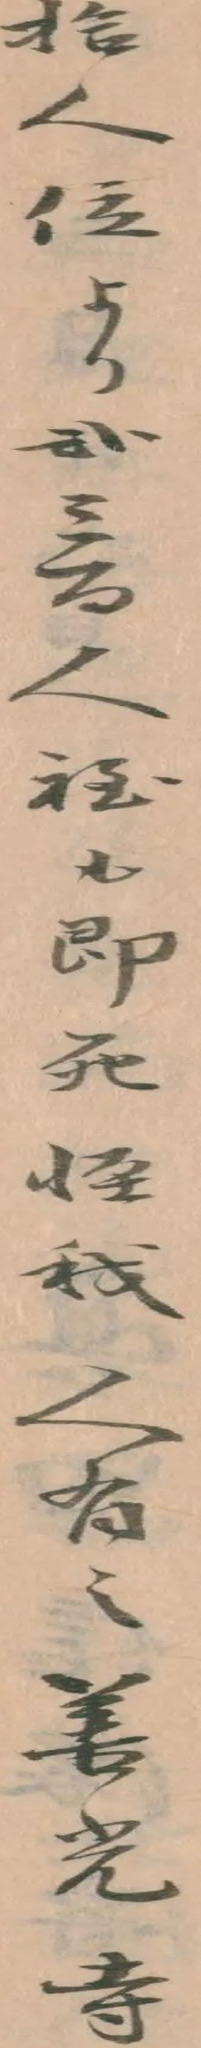拾人位より二三百人程も即死怪我人有之善光寺
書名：地災撮要. 巻3(地震之部)-巻4(噴火之部)
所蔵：国立国会図書館 National Diet Library, JAPAN
